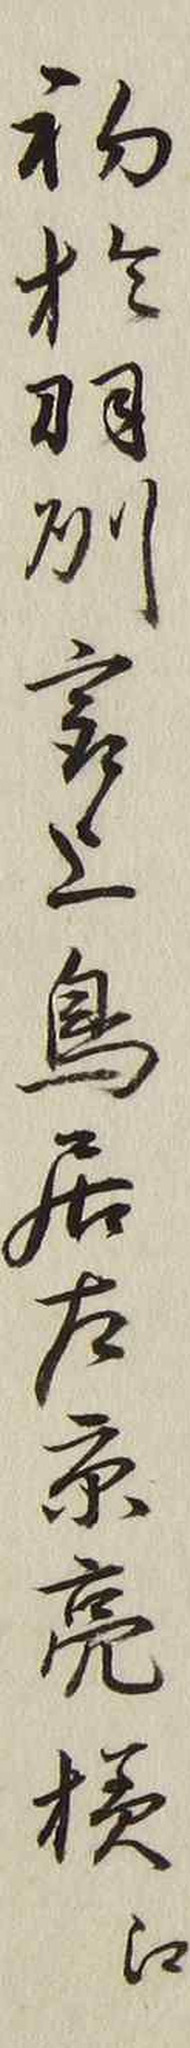初於羽州最上鳥居左京亮様え

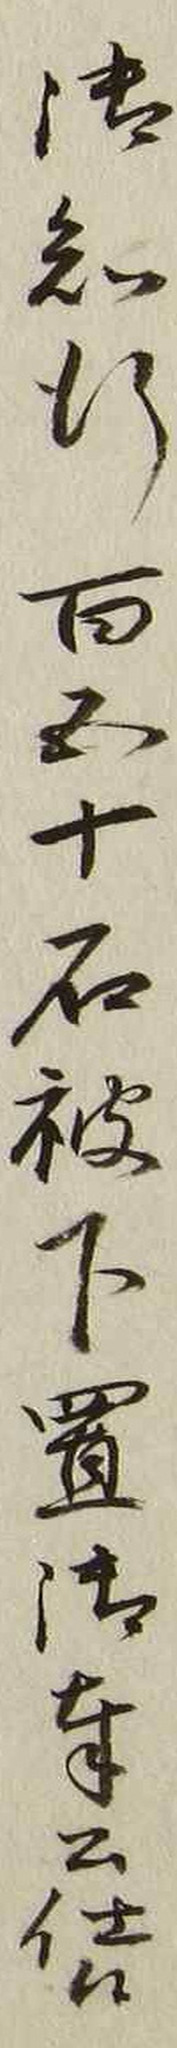御知行百五十石被下置御奉行仕候
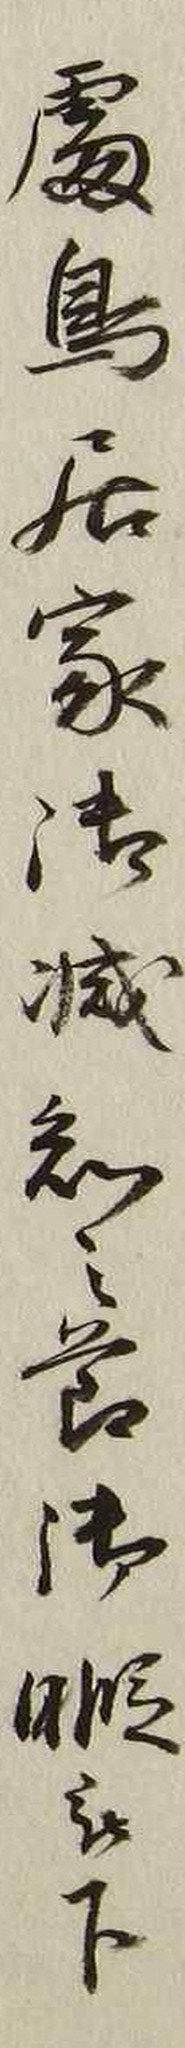處鳥居家御滅知之節御暇被下
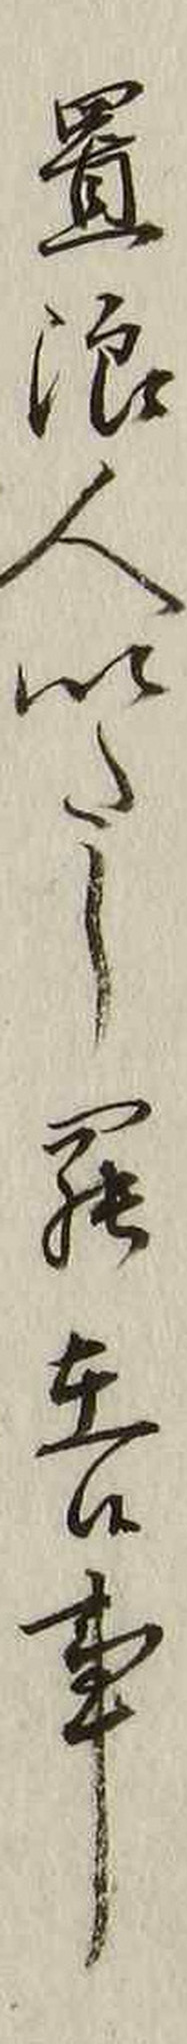置浪人いたし罷在候事
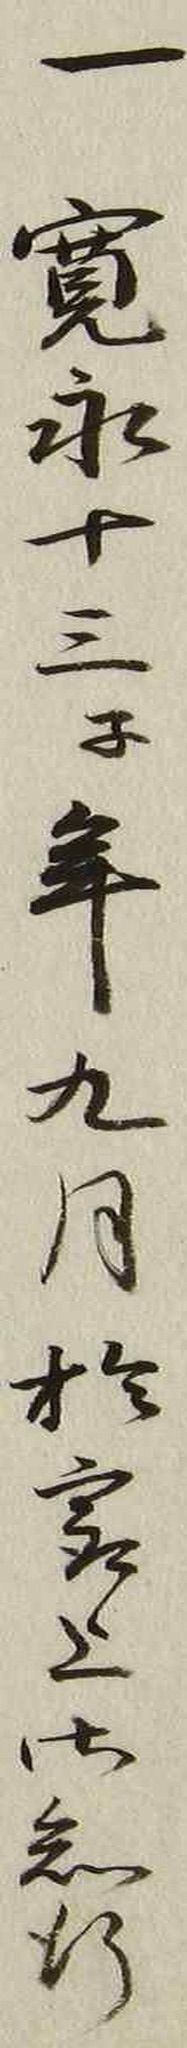一寛永十三子年九月於最上御知行
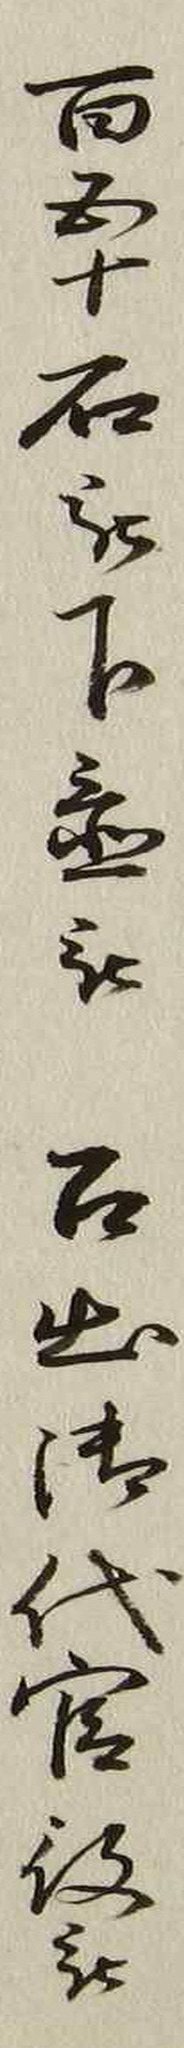百五十石被下置被召出御代官役被
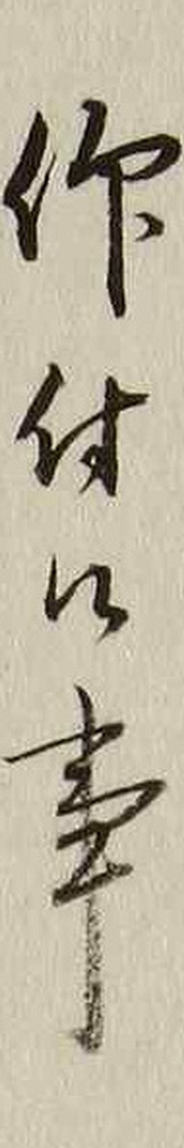仰付候事
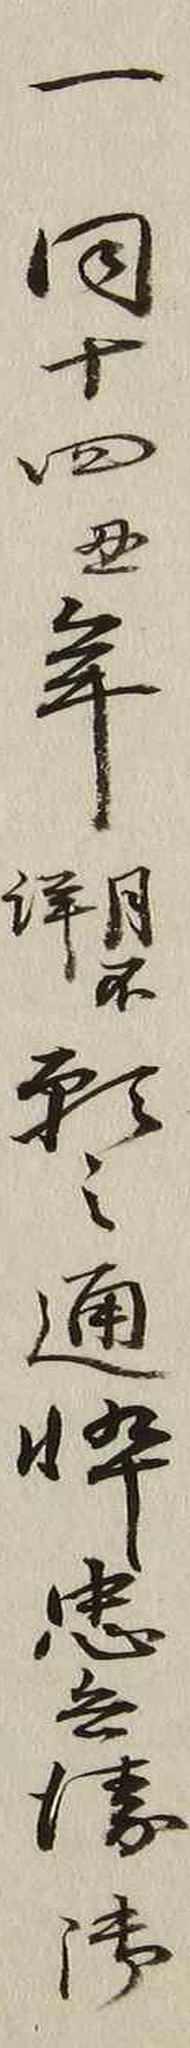一同十四丑年月不詳願之通忰忠兵衛御
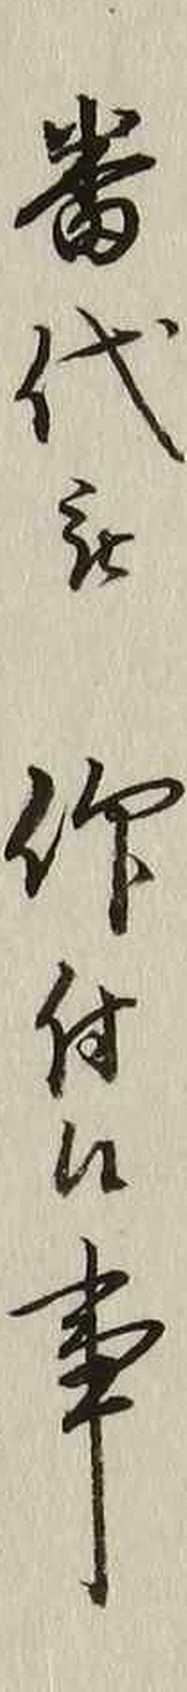番代被仰付候事
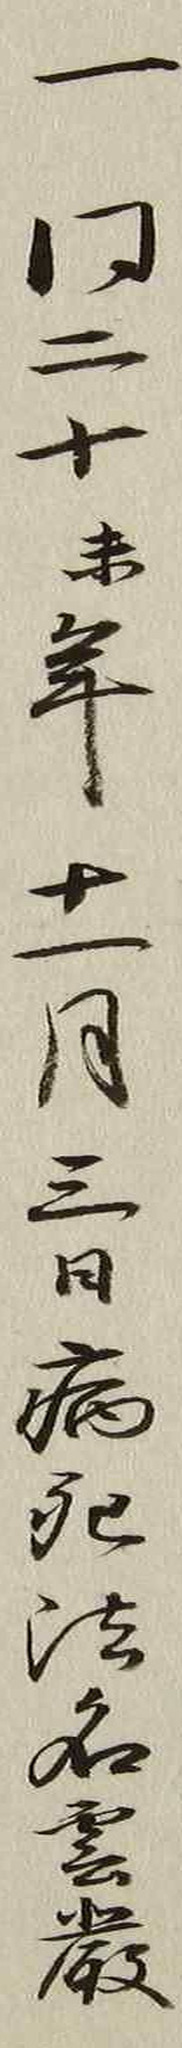一同二十未年十一月三日病死法名雲厳
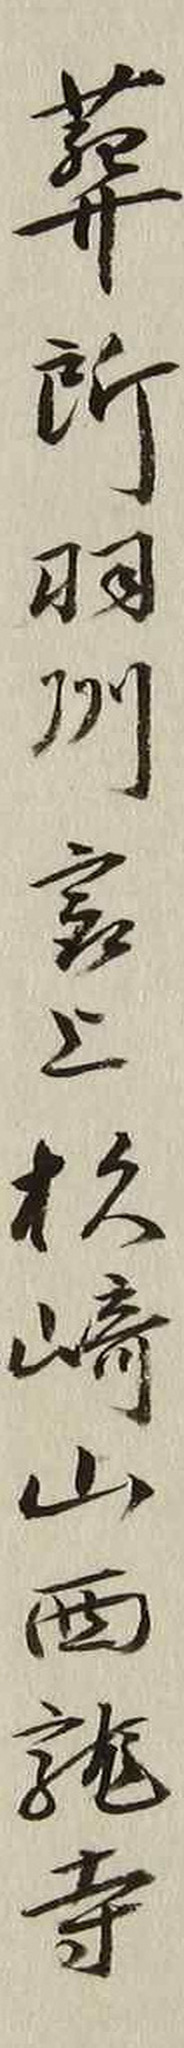葬所羽州最上杉崎山西龍寺
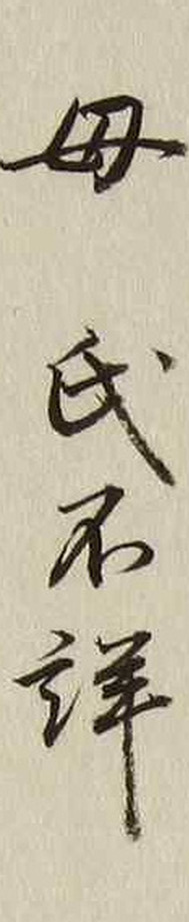母氏不詳
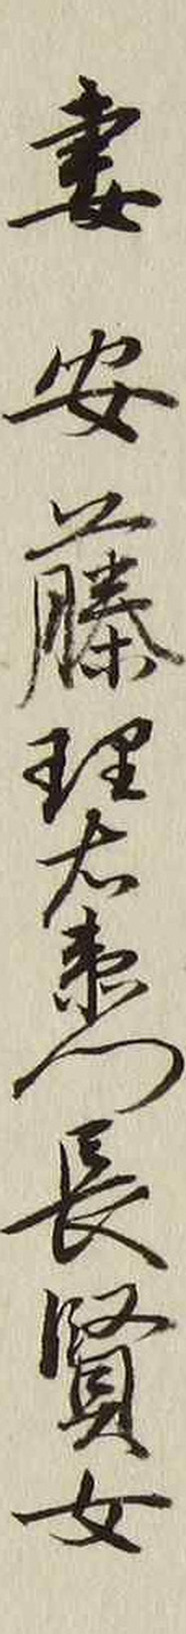妻安藤理右衛門長賢女
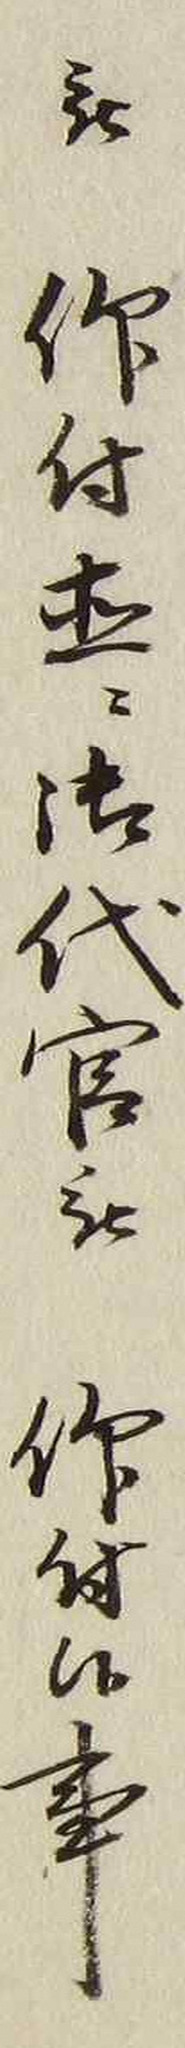被仰付直ニ御代官被仰付候事

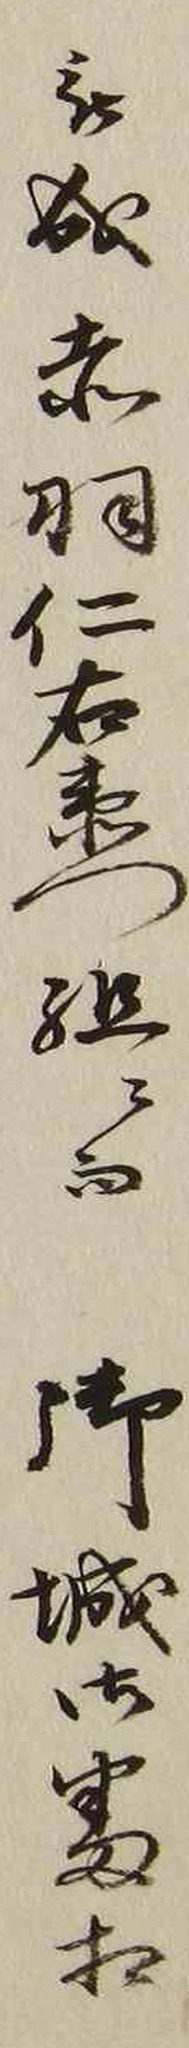被成赤羽仁右衛門組ニ而御城御番相
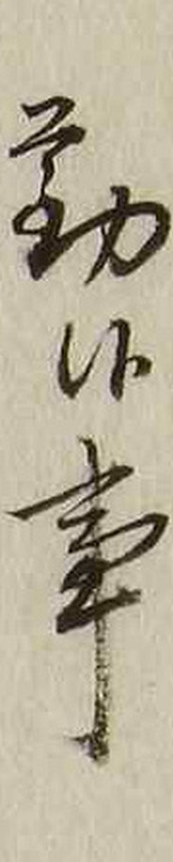勤候事
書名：諸士系譜　巻之160　な之部2
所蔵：会津若松市立会津図書館
